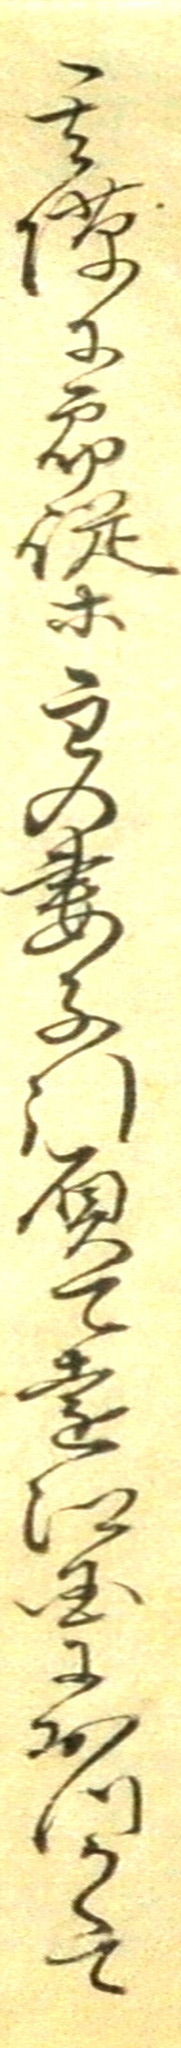其隙に郎従等主の妻子引負て遠江国におつかくて
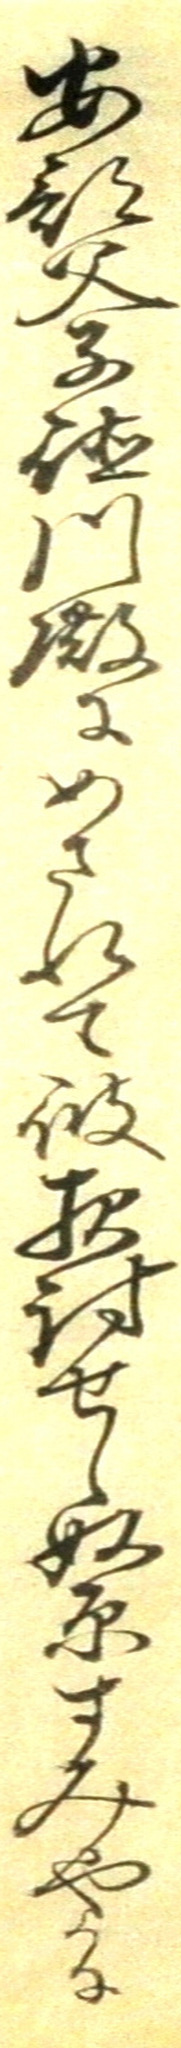安部父子徳川殿にめされて彼夜討せし奴原すみやかに
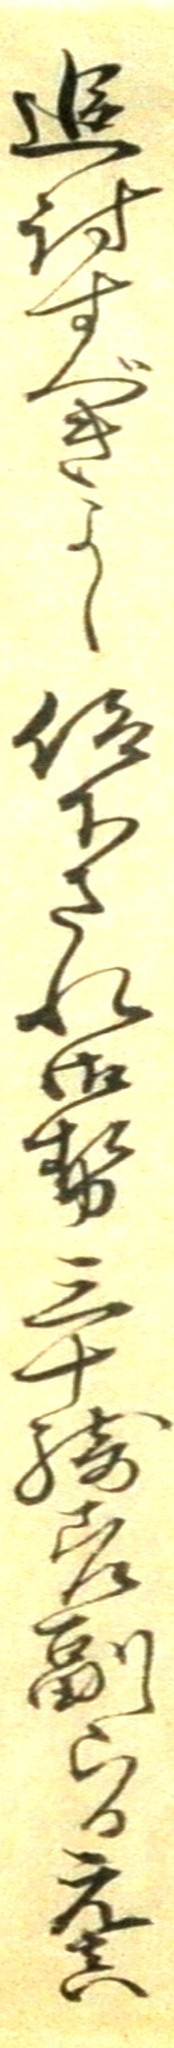追討すべきよし仰下され御勢三十騎差副らる元真
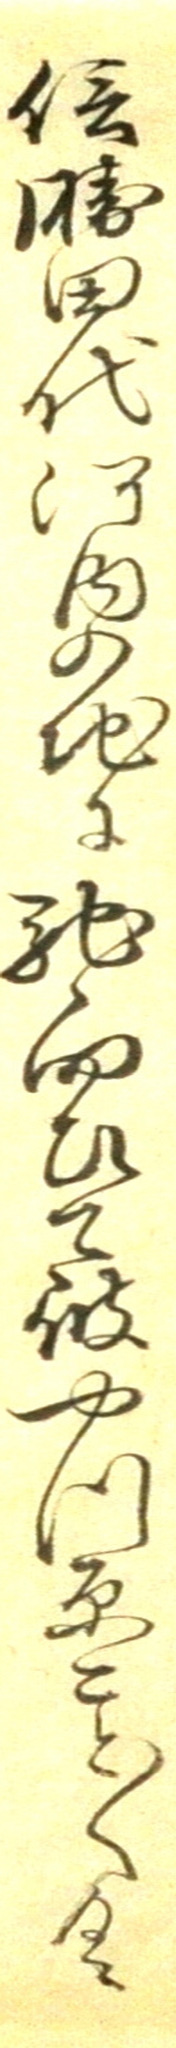信勝田代河内の地に馳向ひて彼やつ原こと〳〵く
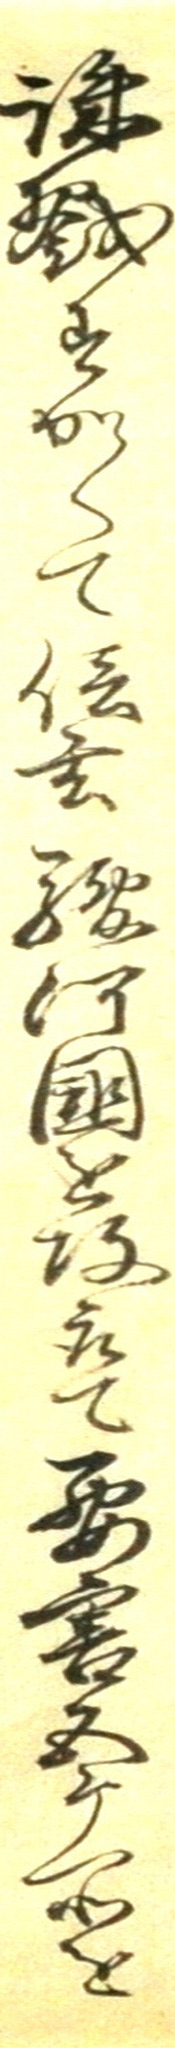誅戮すかくて信玄駿河国を攻取て要害五ヶ所を
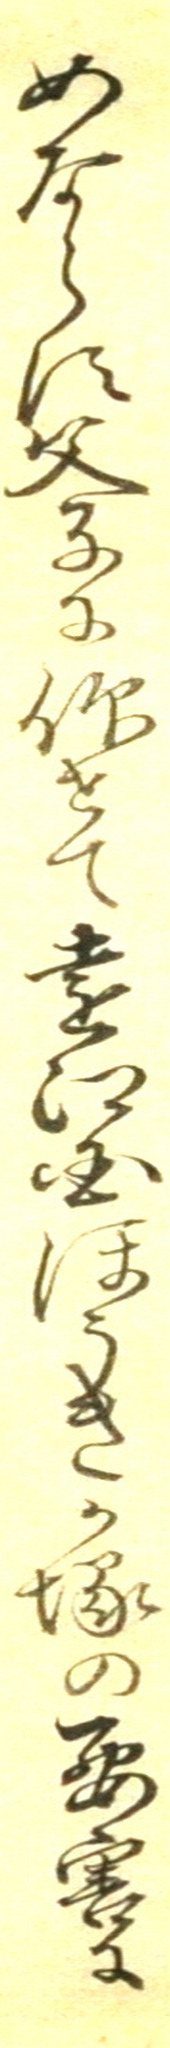めならす父子に仰せて遠江国ほうきか塚の要害に
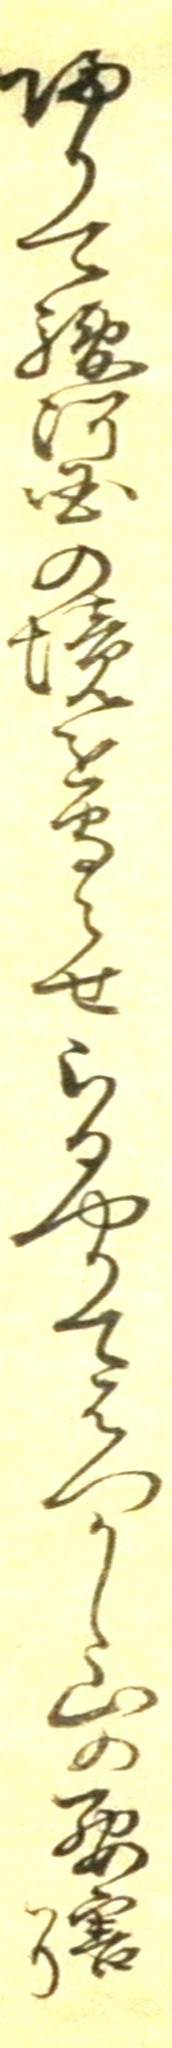帰りて駿河国の境を守らせらるやかてはつかし山の要害に
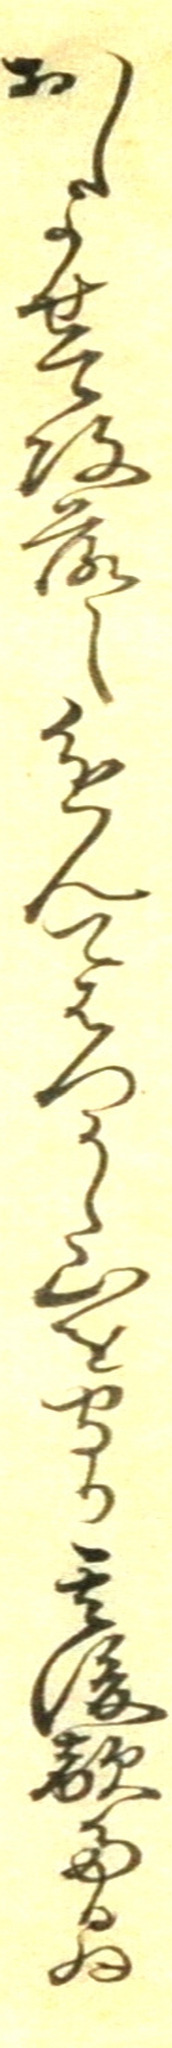おしよせて攻落し進んてはつかし山を守り其後敵たるゐ
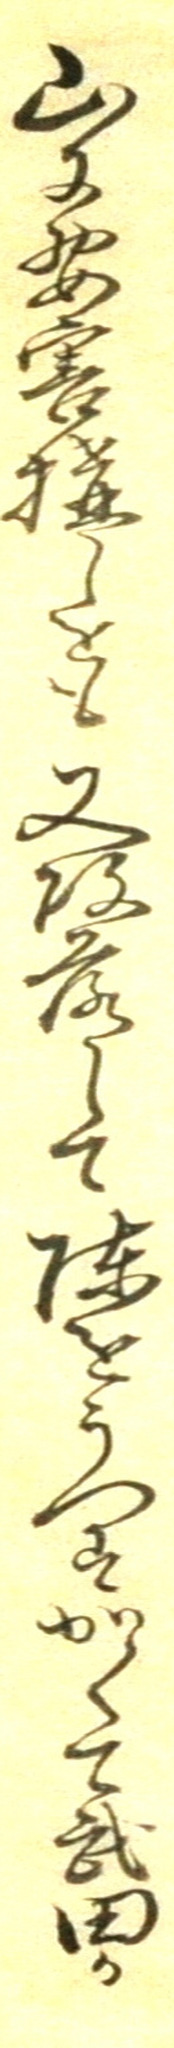山に要害構しをも又攻落して陣をうつすかくて武田か
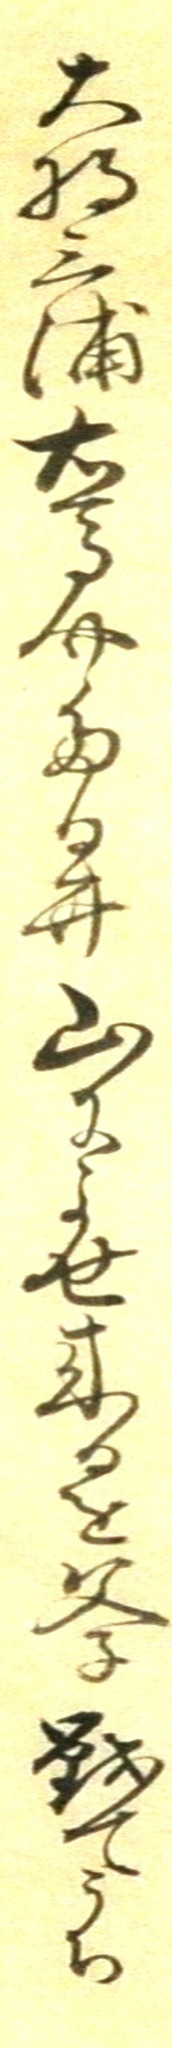大将三浦右馬介たる井山によせ来るを父子戦てうち
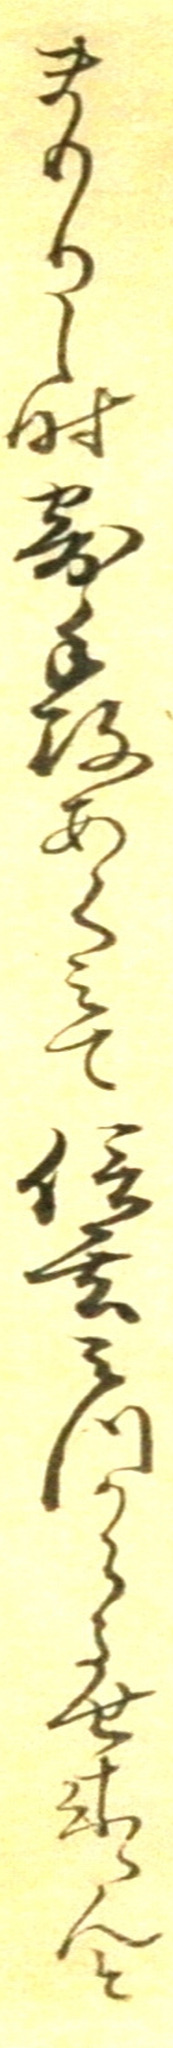まもりし時寄手攻あくみて信玄みつからよせ来らんと
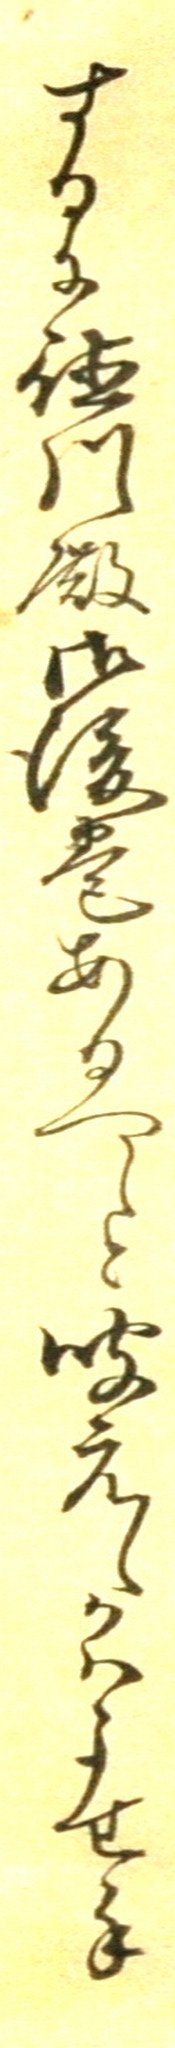するに徳川殿御後巻あるへしと聞えしかはよせ手

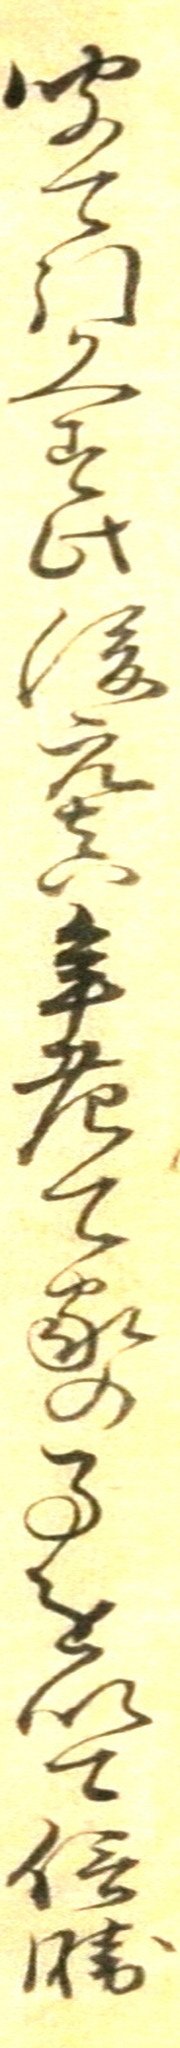聞て引かへす此後元真年老て家の事を以て信勝
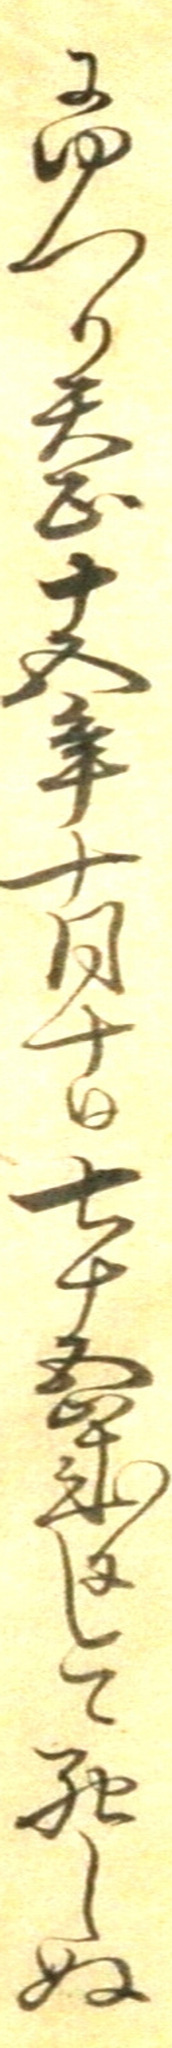にゆつり天正十五年十月十日七十五歳にして死しぬ
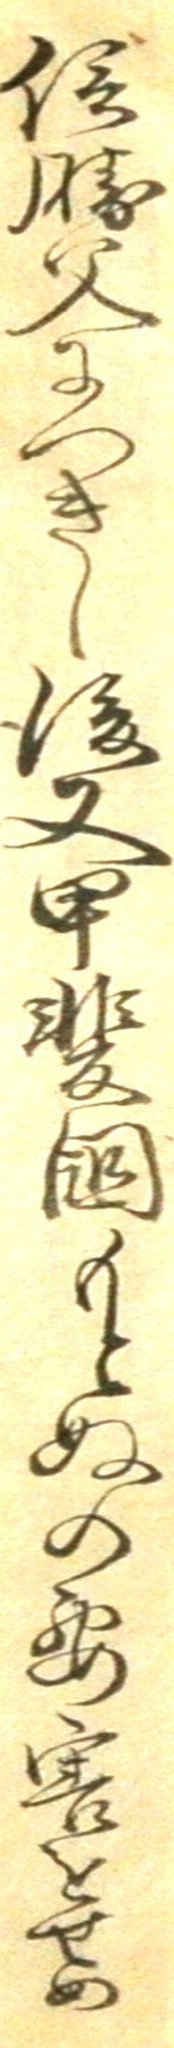信勝父につきし後又甲斐国もとぬの要害をせめ
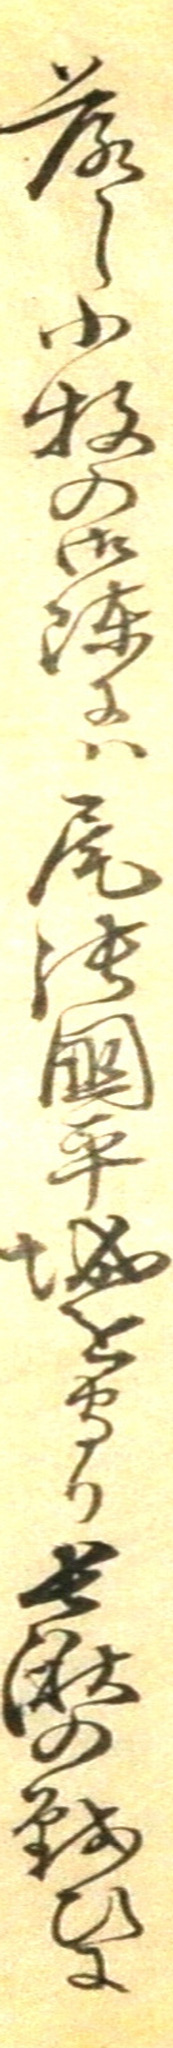落し小牧の御陣には尾張国平城を守り長湫の戦ひに
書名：藩翰譜（四・中）
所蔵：伊那市立高遠町図書館・合同会社AMANE
